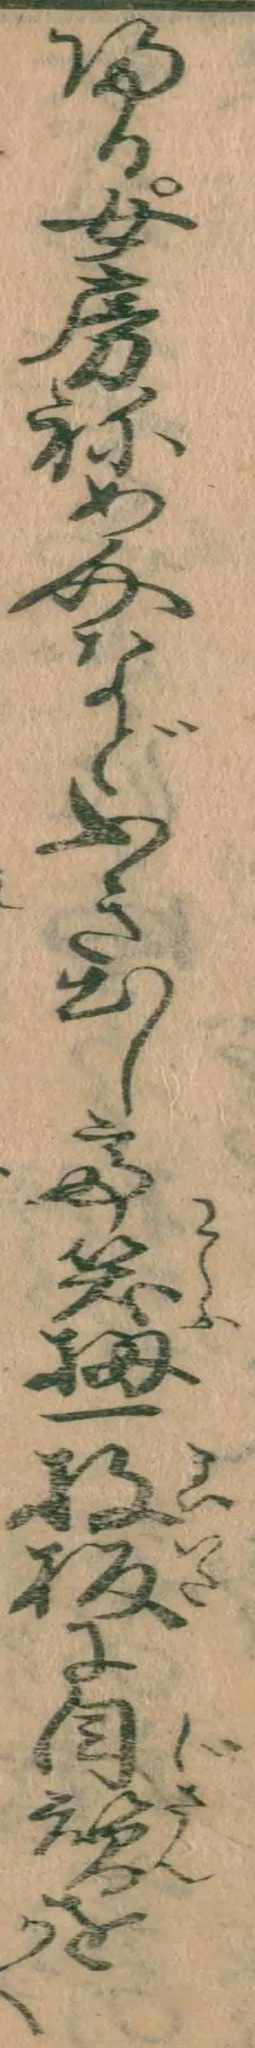帰る。女房め介ねなどふき出して笑扨一枚板に自讃をかく
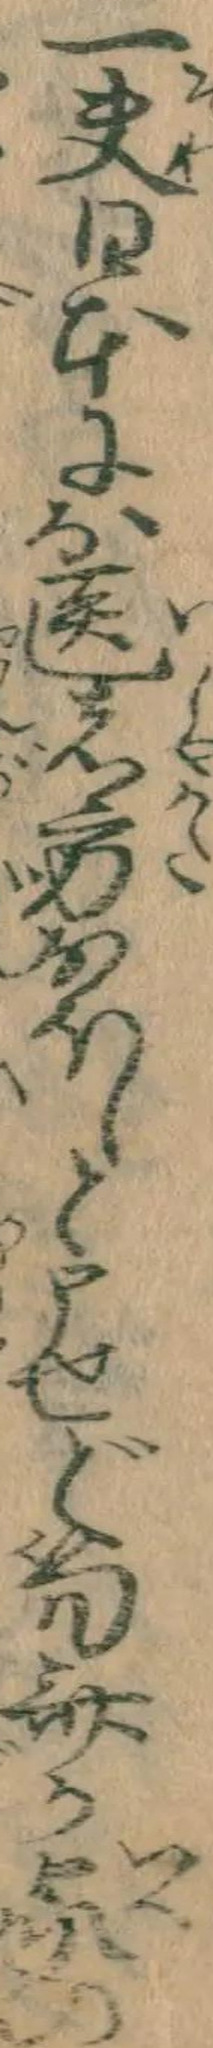一夫日本にお医者方おほしと申せど筍斎か家の
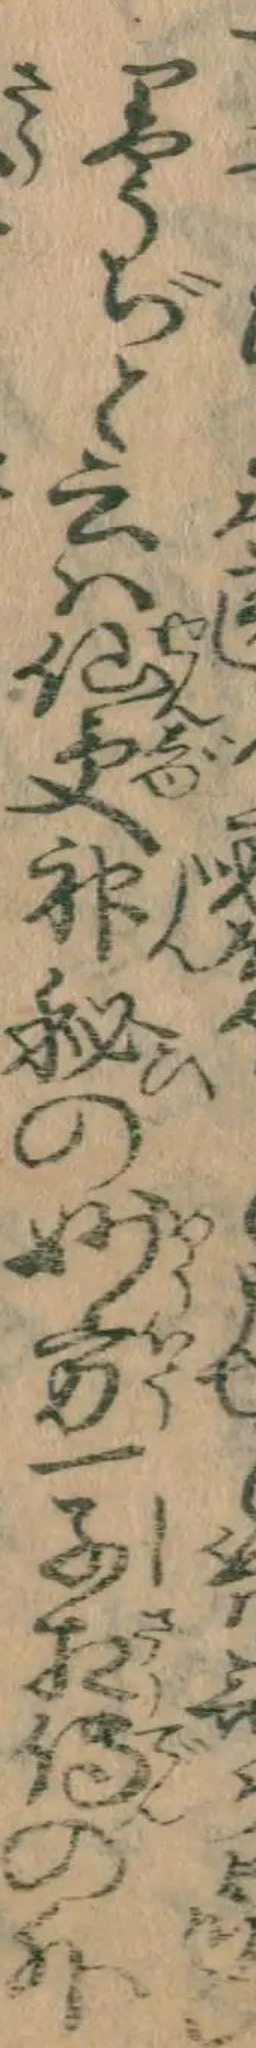りやうぢと云は仙受神秘の妙方一子相伝の外
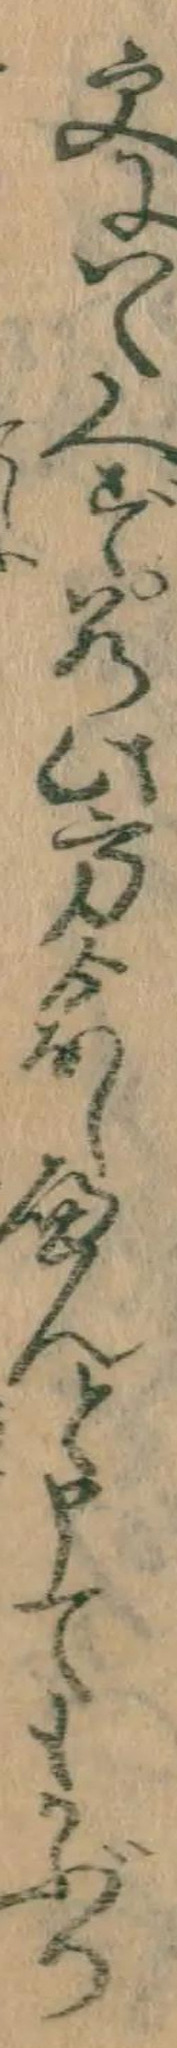更につたへず。若此方ゟおしへんと申てもかぶり
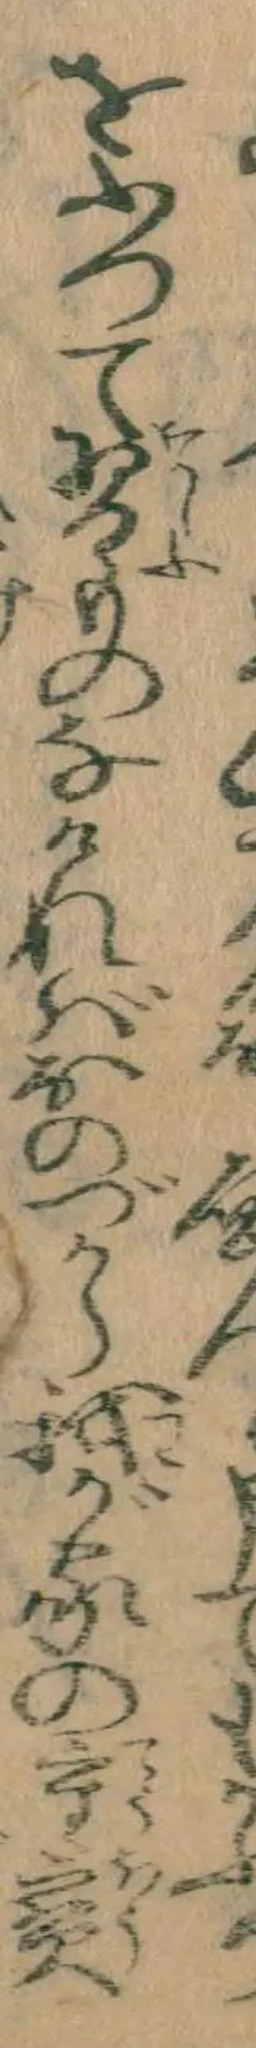をふつて習ものなければおのづから我が家の重宝
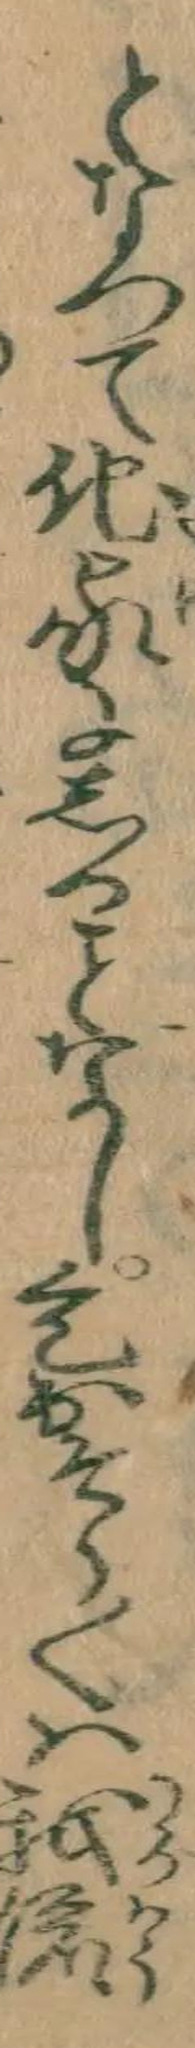となつて他家にしることなし。是おそら〱は我流
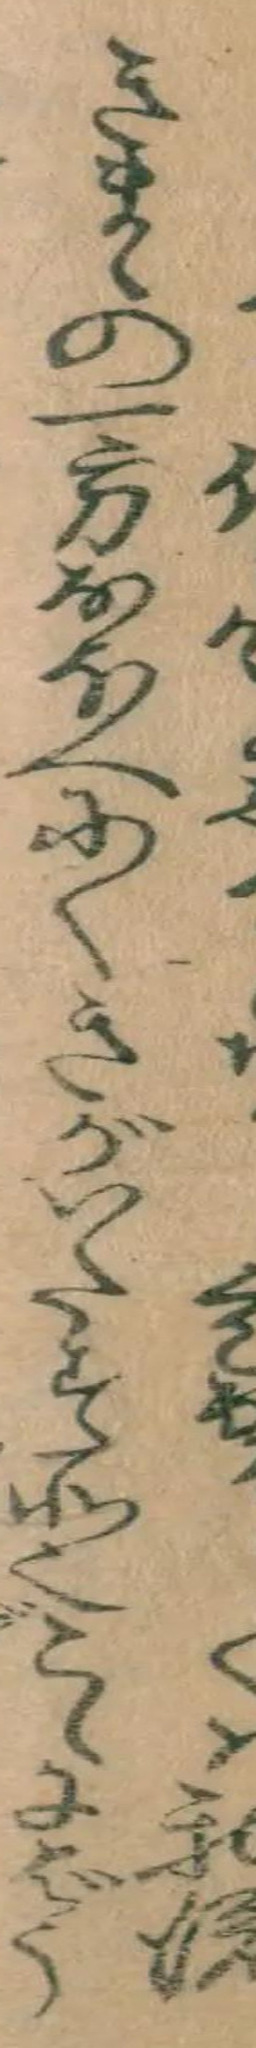きまゝの一方おほへにくきがいたす所也こゝにばう
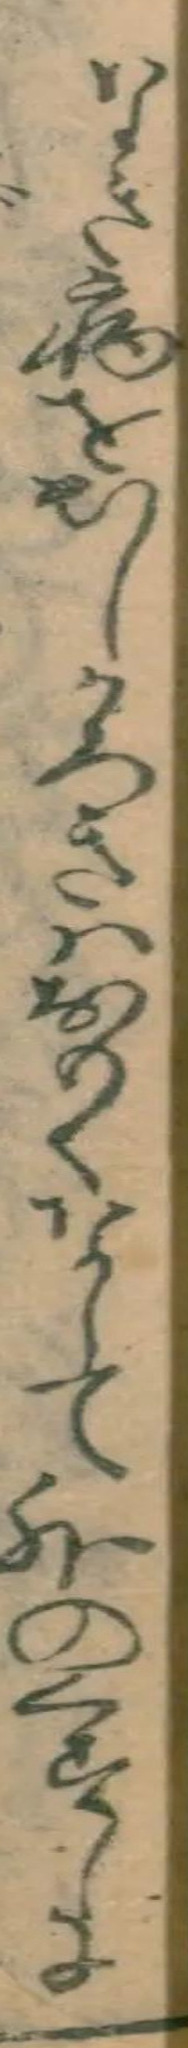なき病を出しかろきはおもくなして外のくすしに
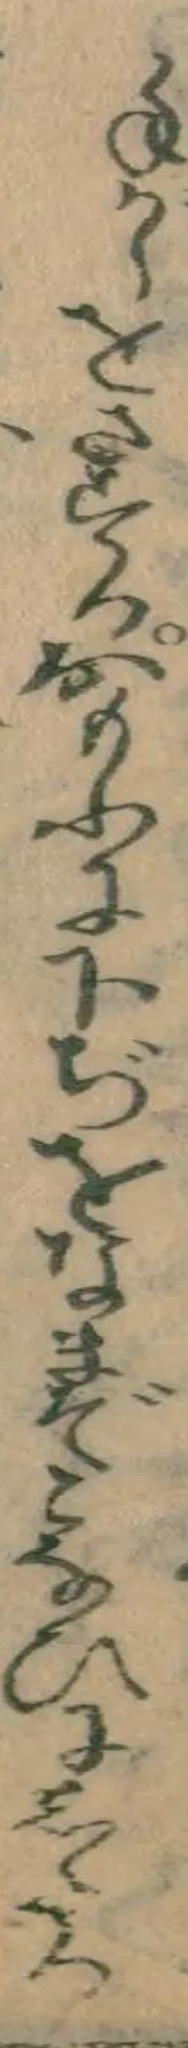手がらをさする。おもふに下ぢをなまぞこなひにしたる
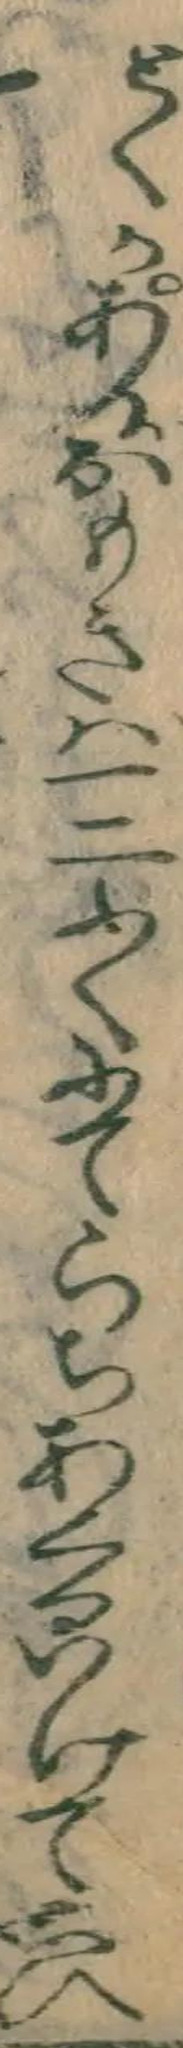とくか。あるはおもきは一二ふくにてらちあくるいけて思ひ
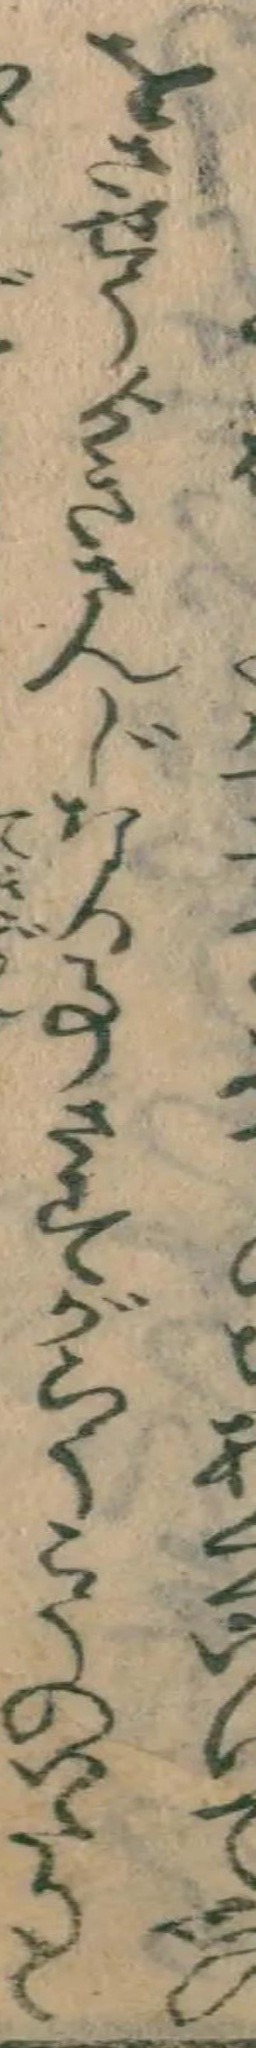をさせうゟきさんじなる事さすがらうこうのいたりと
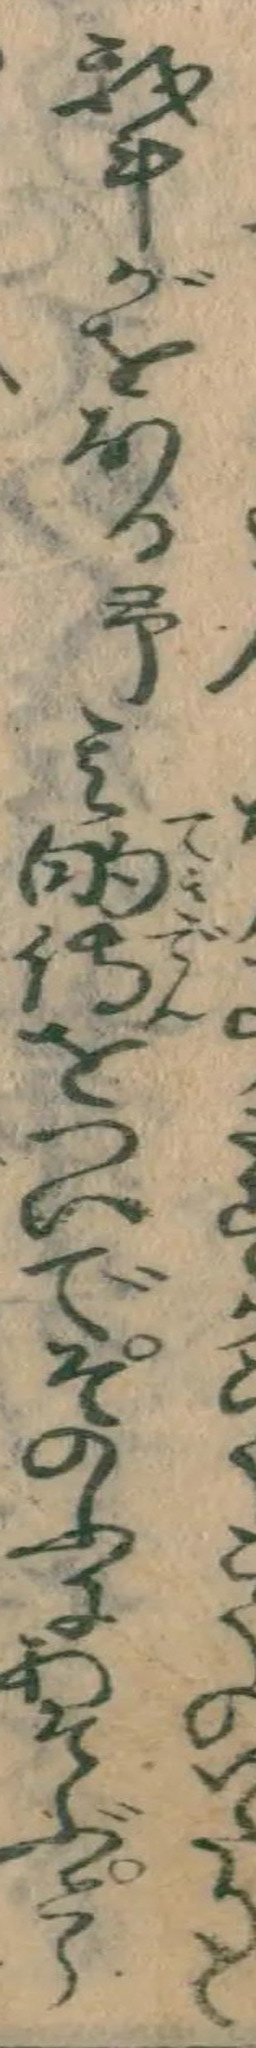我計がをほる予其的伝をついで。そのふにあそぶ。とら
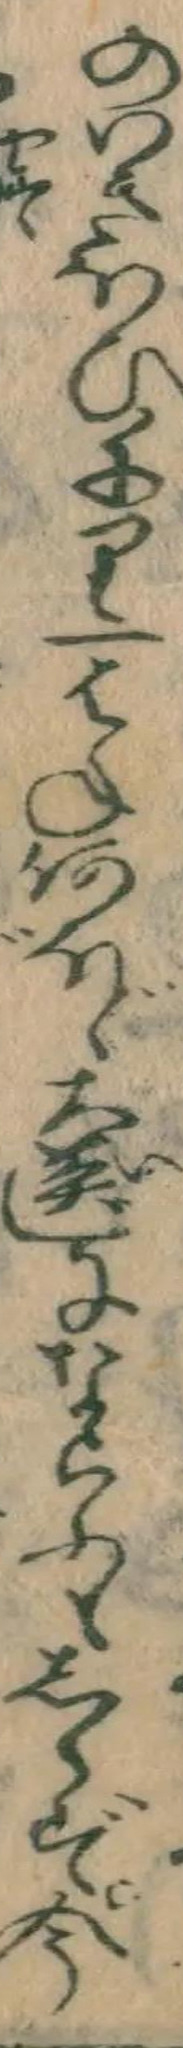のいきほひ千里一はね何ほど大医にならふもしらず。今
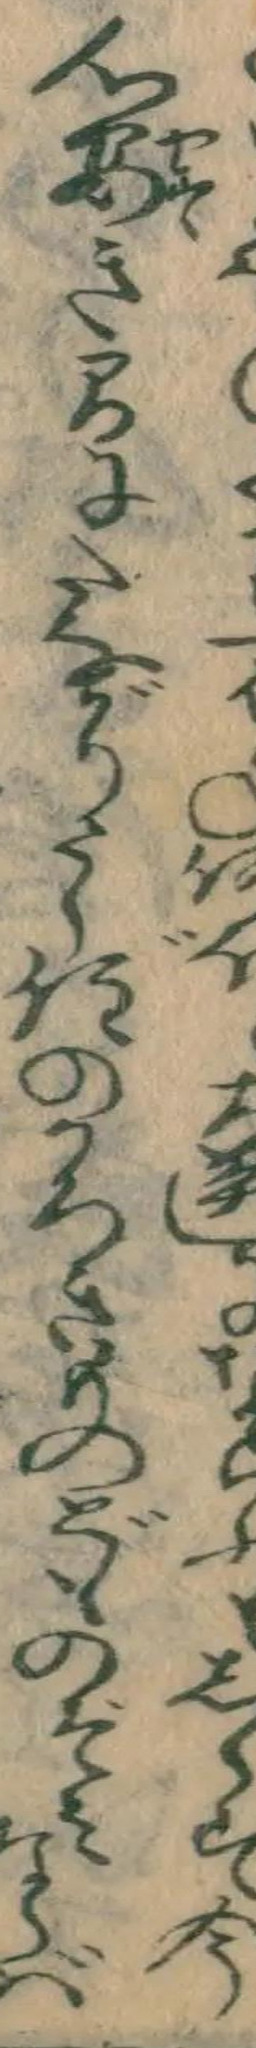心安き間にたながりうら住のかろきものどものぞみならば
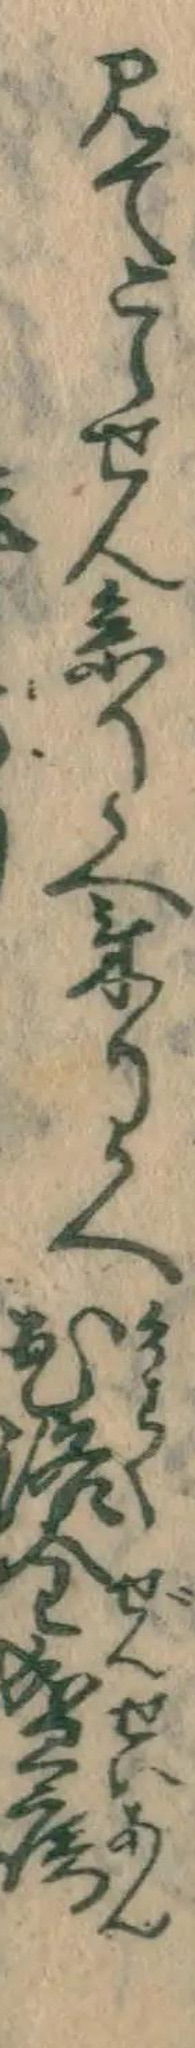見てとらせん参り候へ参り候へ花洛全盛庵
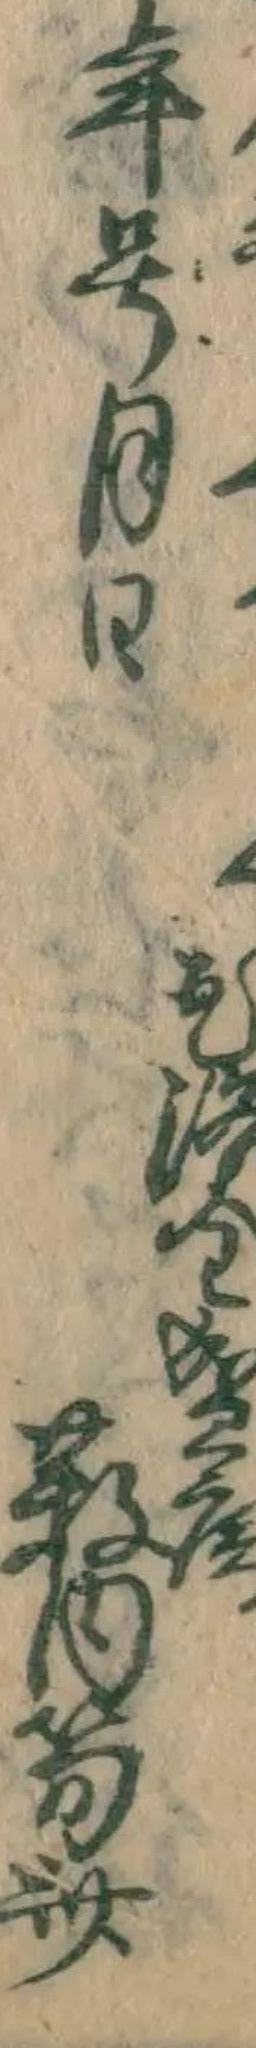年号月日薮内筍斎
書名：新竹斎 5巻
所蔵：国立国会図書館 National Diet Library, JAPAN
